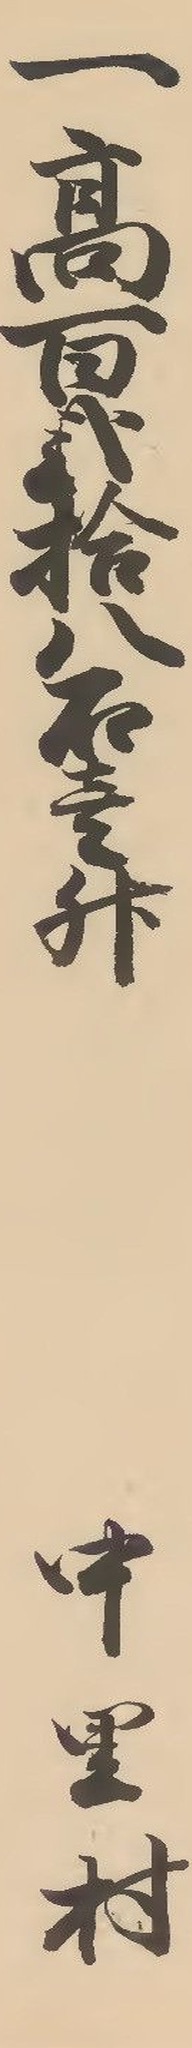一髙百弐拾八石壱升中里村

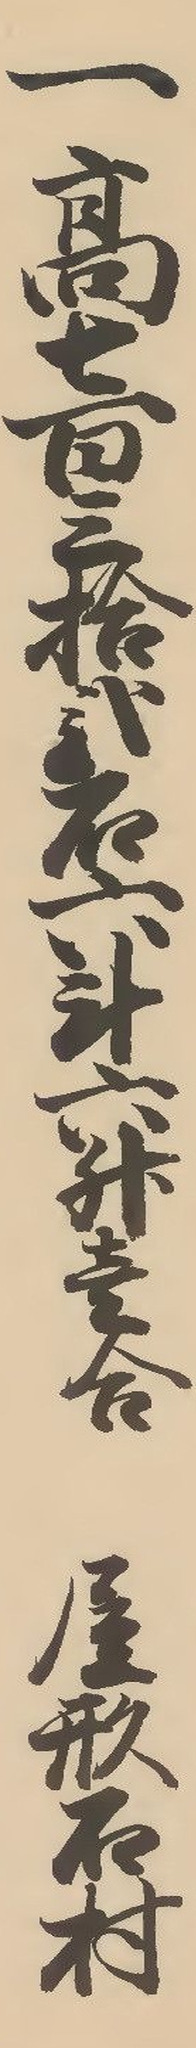一髙七百三拾弐石六斗六升壱合屋形石村
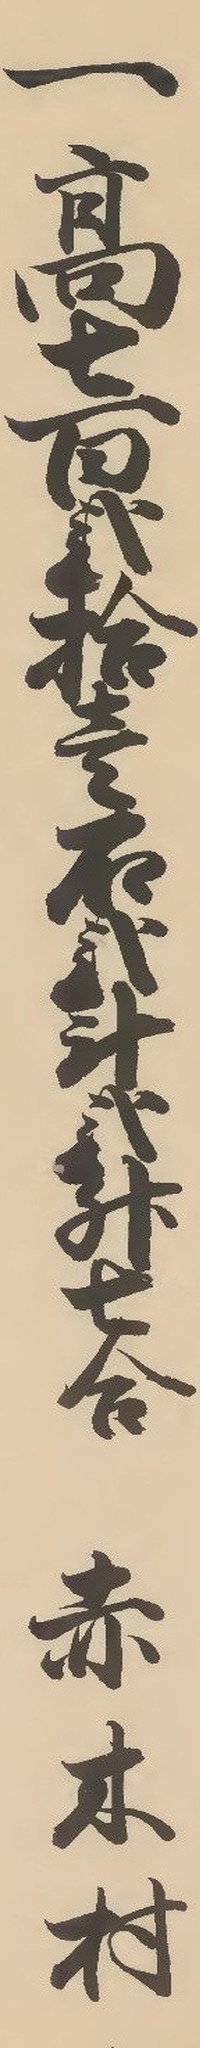一髙七百弐拾壱石弐斗弐升七合赤木村
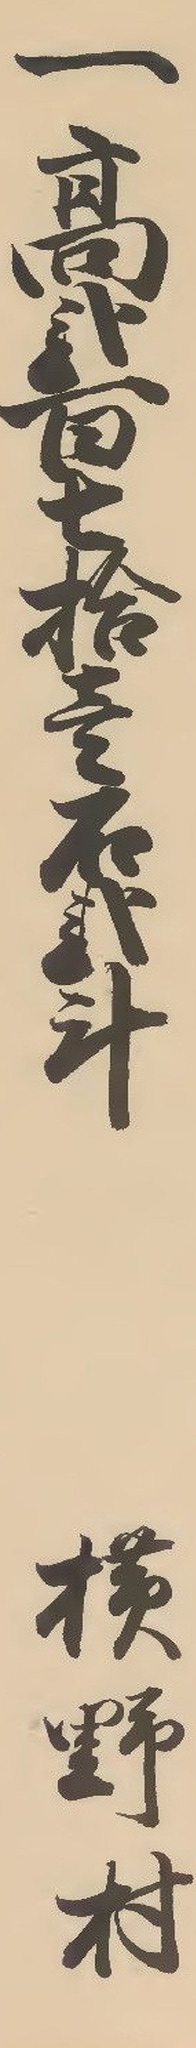一髙弐百七拾壱石弐斗横野村
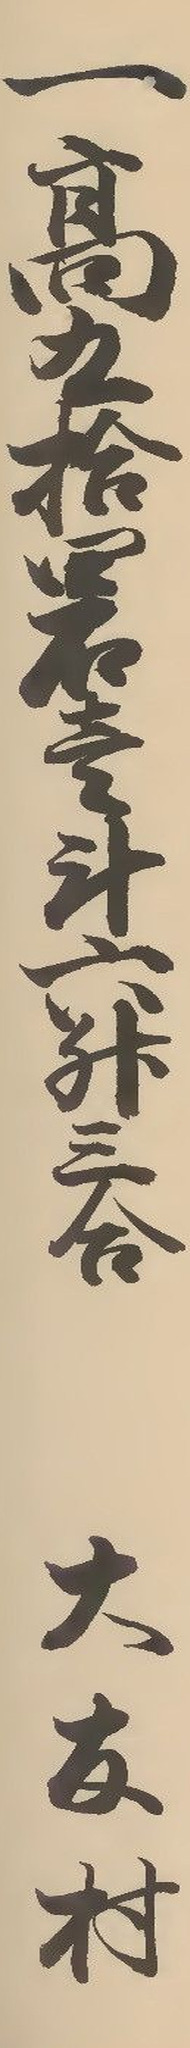一髙九拾四石壱斗六升三合大友村
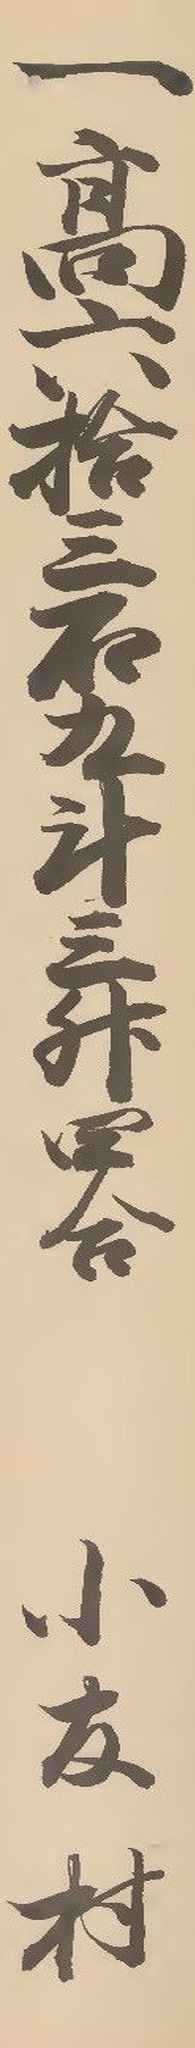一髙六拾三石九斗三升四合小友村
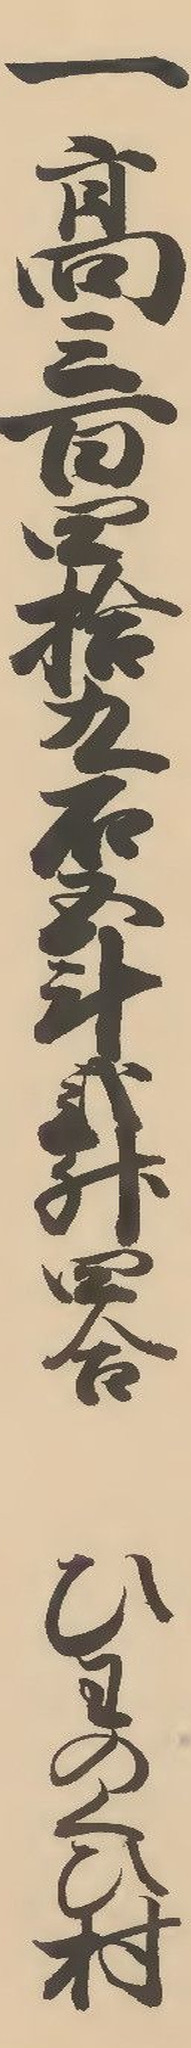一髙三百四拾九石五斗弐升四合ひわのくひ村
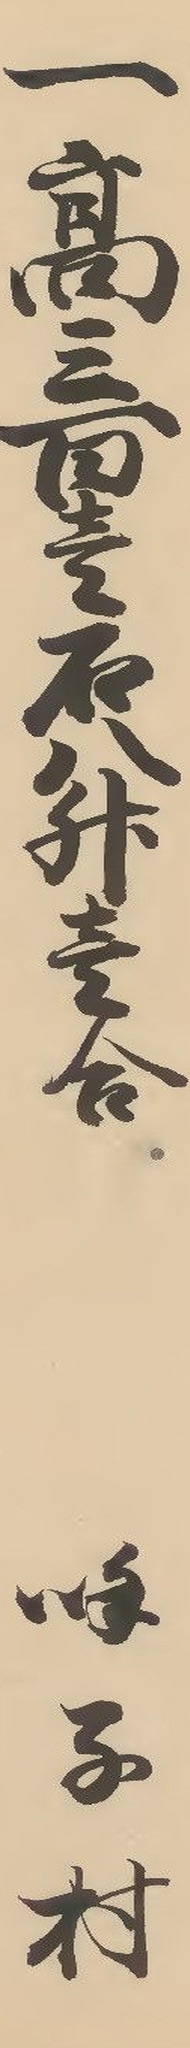一髙三百壱石八升壱合呼子村
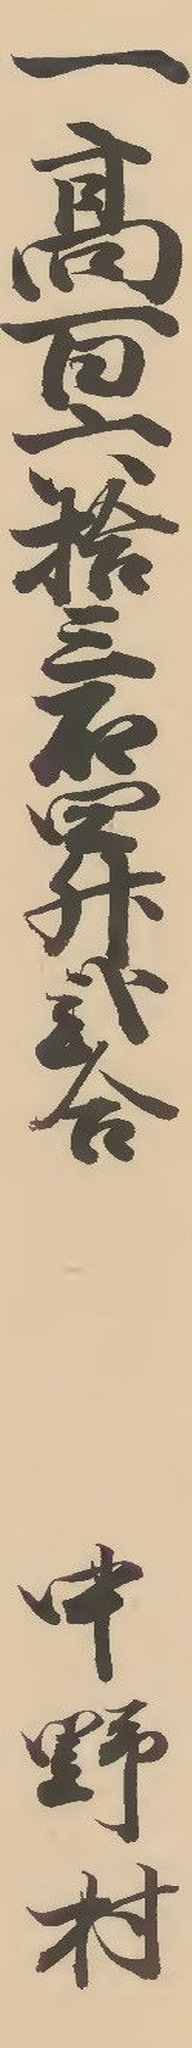一髙百六拾三石四升弐合中野村

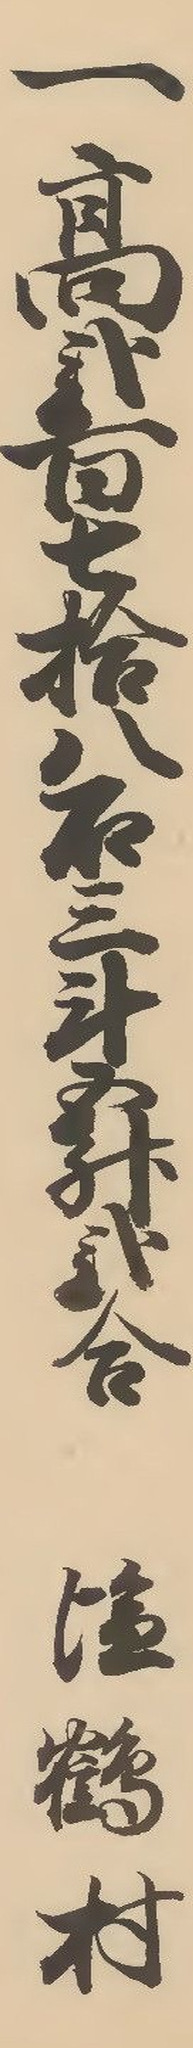一髙弐百七拾八石三斗五升弐合塩鶴村
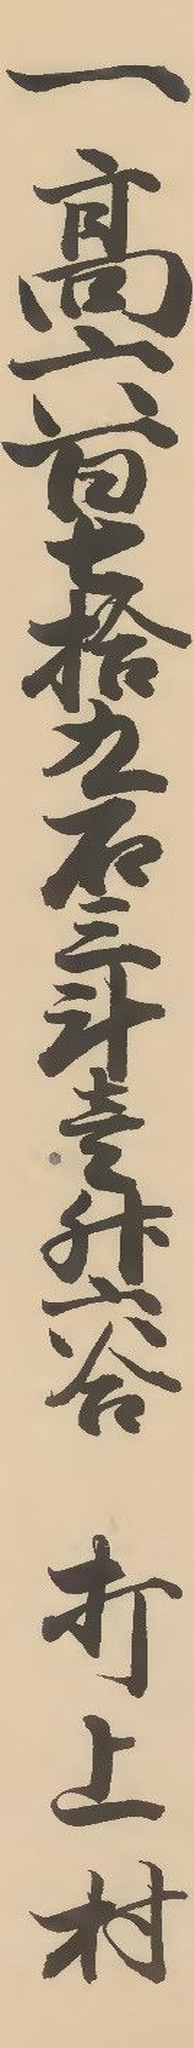一髙六百七拾九石三斗壱升六合打上村
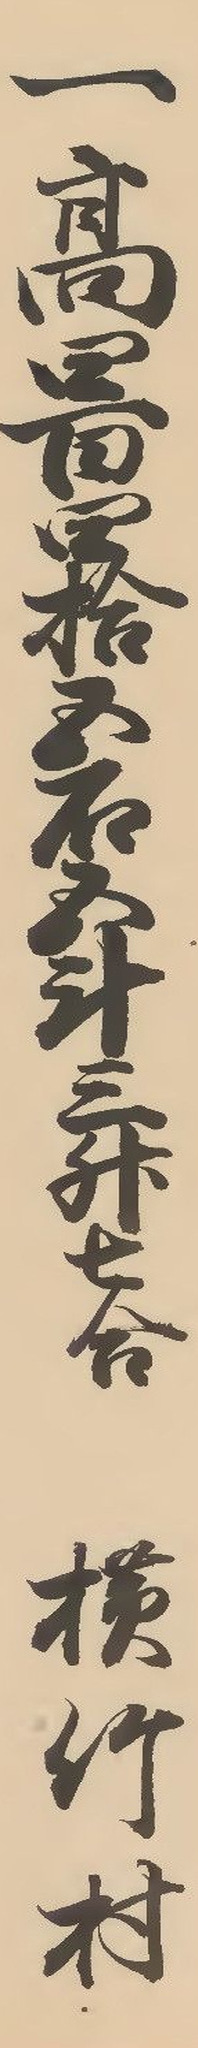一髙四百四拾五石五斗三升七合横竹村
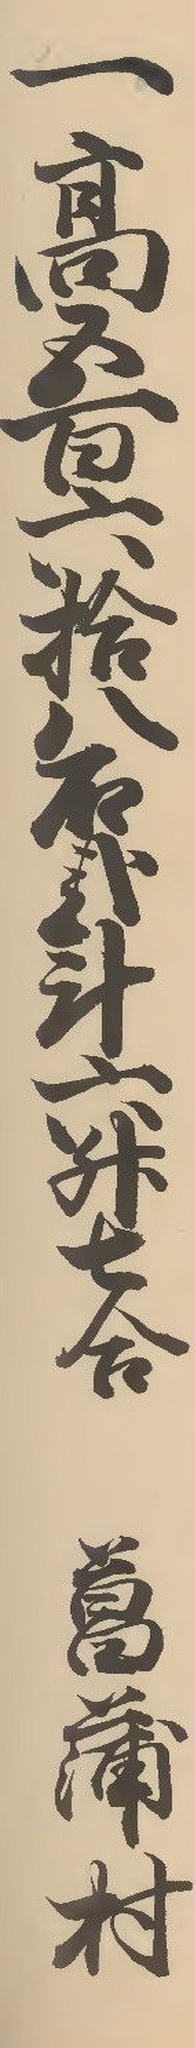一髙五百六拾八石弐斗六升七合菖蒲村
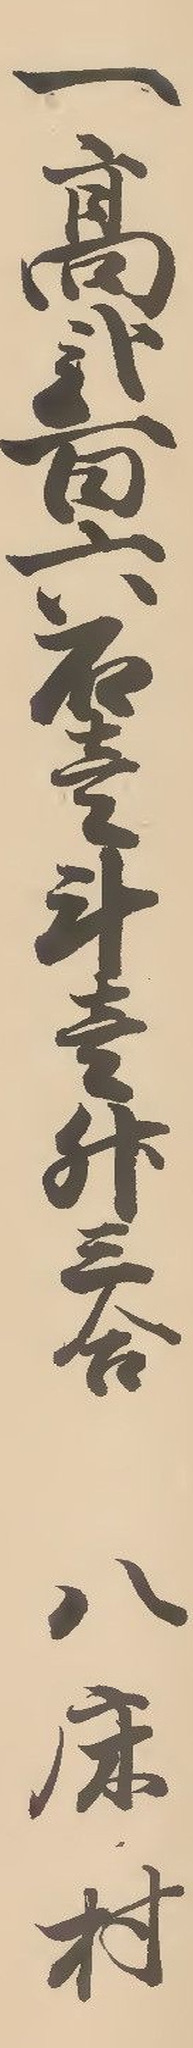一髙弐百六石壱斗壱升三合八床村
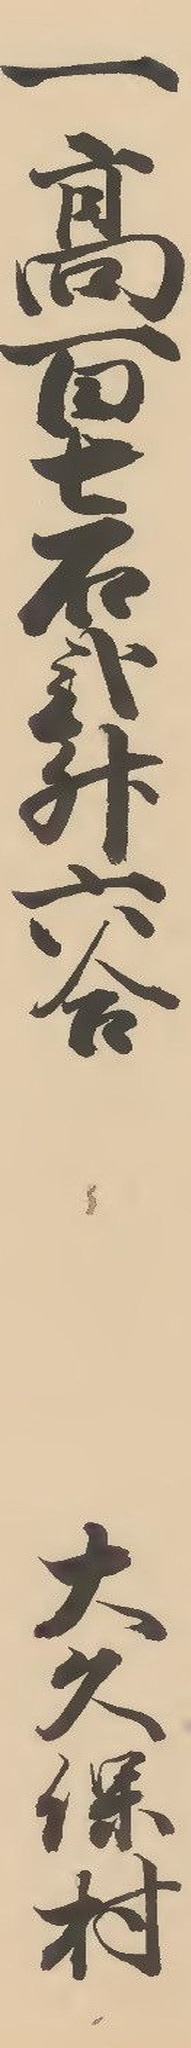一髙百七石弐升六合大久村
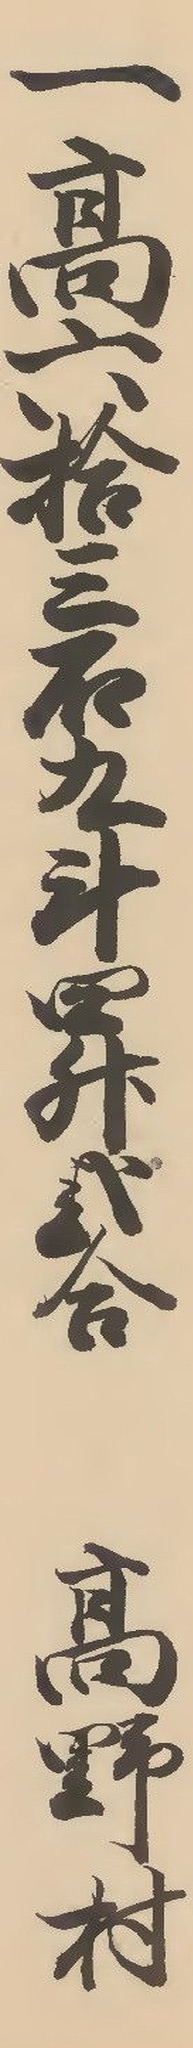一髙六拾三石九斗四升弐合髙野村
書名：肥前国郷帳
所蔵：国立公文書館 National Archives of Japan
